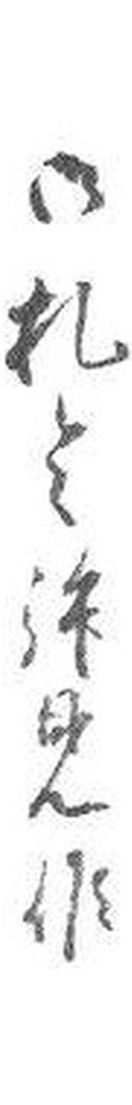御札令拝見候
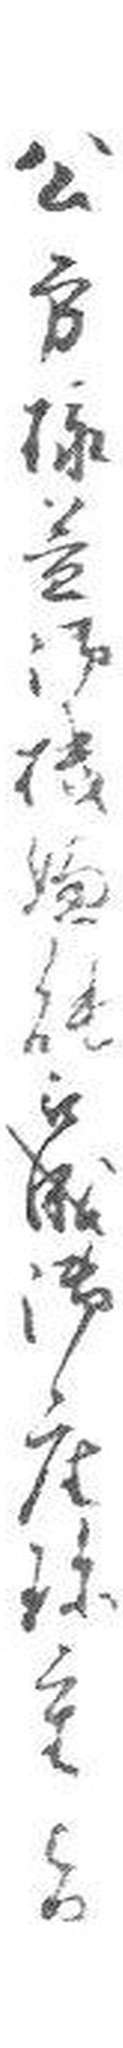公方様益御機嫌能被成御座珍重旨
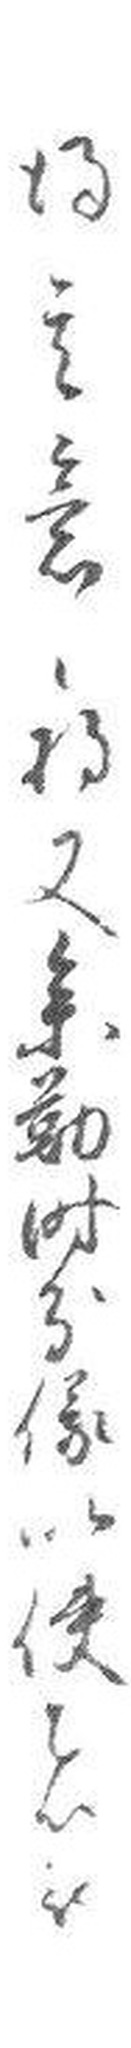得其意候将又参勤時分儀以使者被
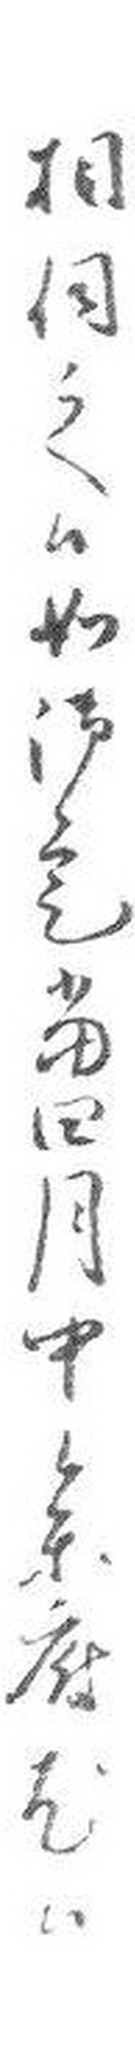相伺之候如御定当四月中参府尤候
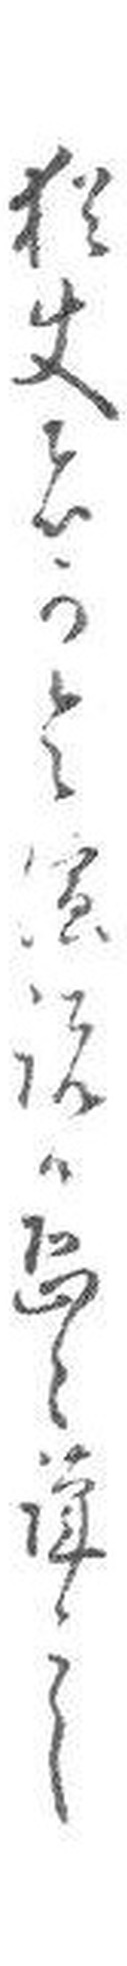猶使者可令演説候恐々謹言
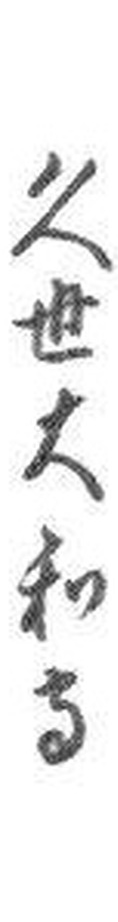久世大和守
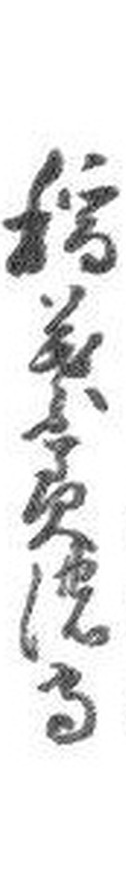稲葉美濃守
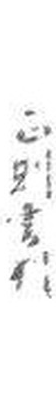正則書判
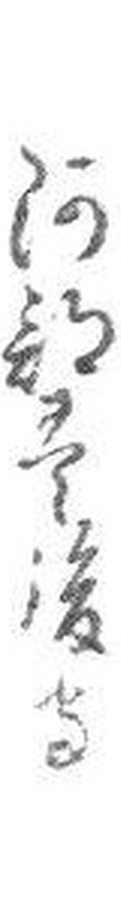阿部豊後守
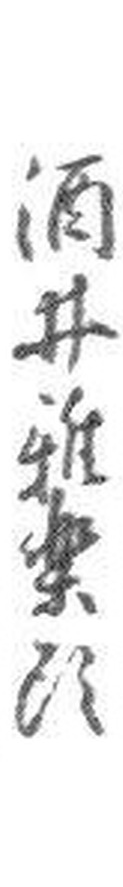酒井雅楽頭
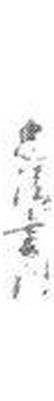忠清書判
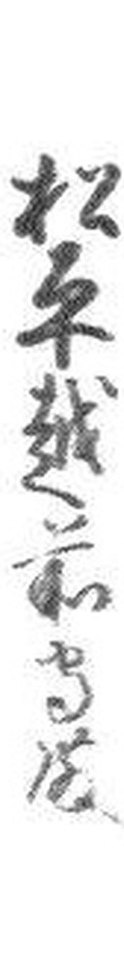松平越前守殿
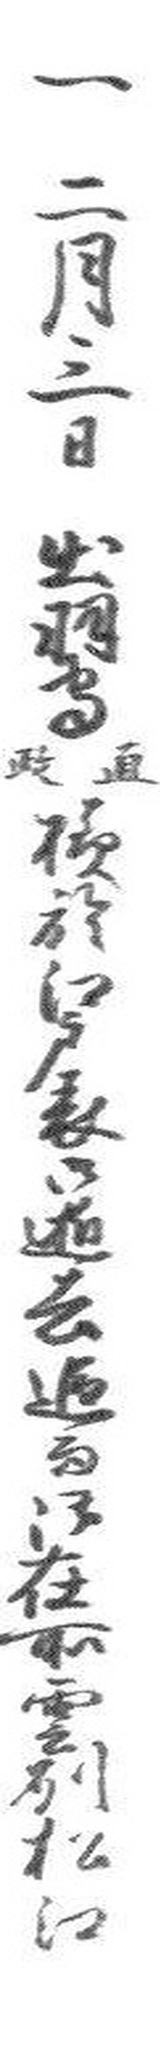一二月三日出羽守直政様於江戸表御逝去追而御在所雲州松江
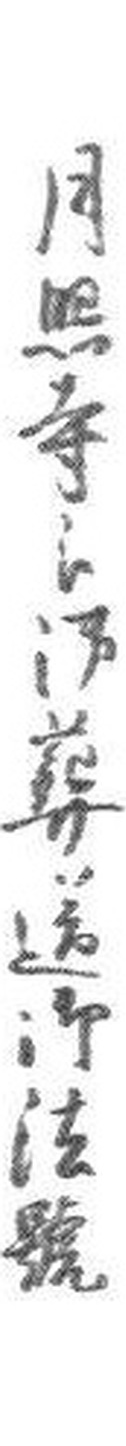月照寺江御葬送御法号
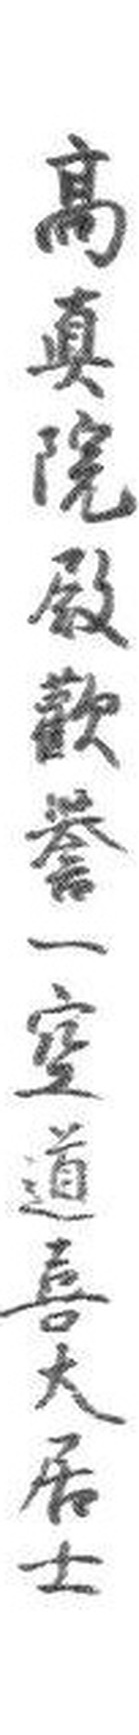高真院殿歓誉一空道喜大居士

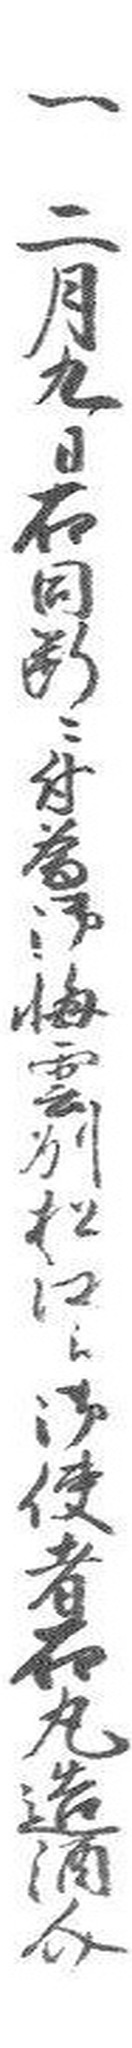一二月九日右同断ニ付為御悔雲州松江江御使者石丸造酒介
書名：家譜 七 光通公 従寛文四年到同九年
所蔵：福井県文書館 Fukui Prefectural Archives
